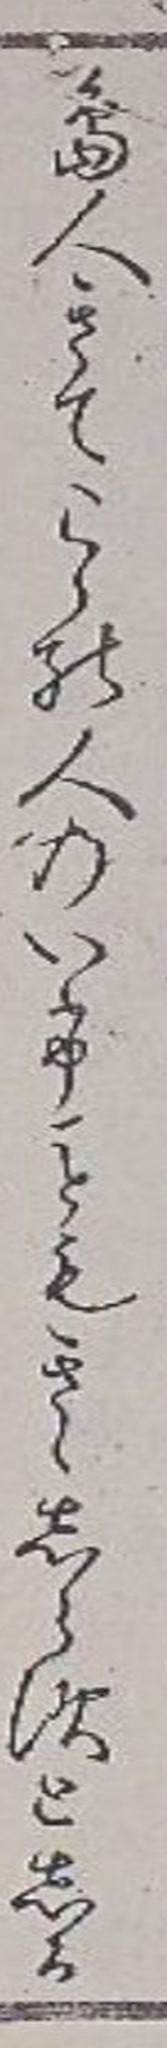島人きてこゝの人のいふこともきゝしらすとしか
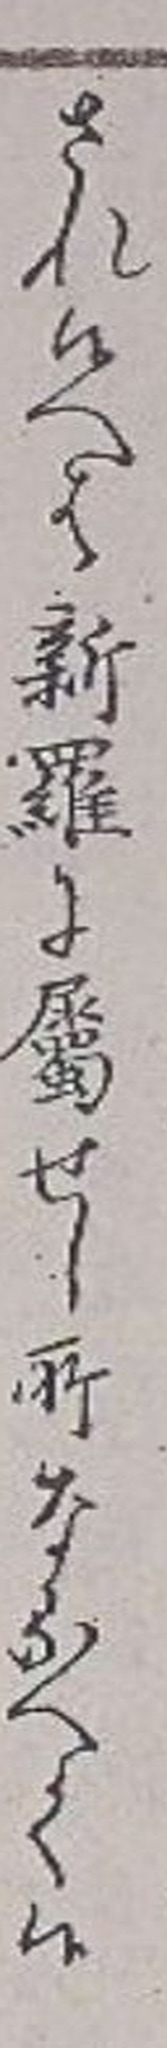され候へは新羅に属せし所なるへく候
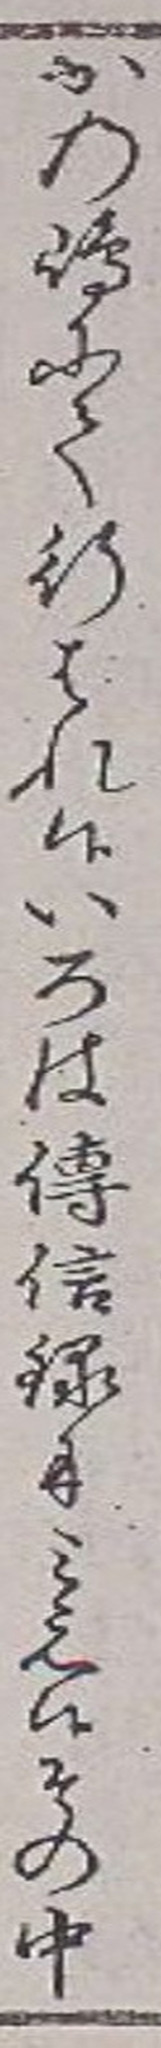かの島にて行はれ候いろは伝信録にみえ候その中
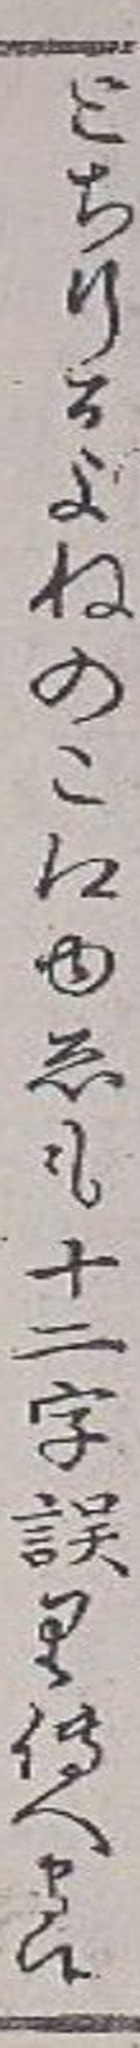とちりかよねのこはゆゑも十二字誤り伝へ申候
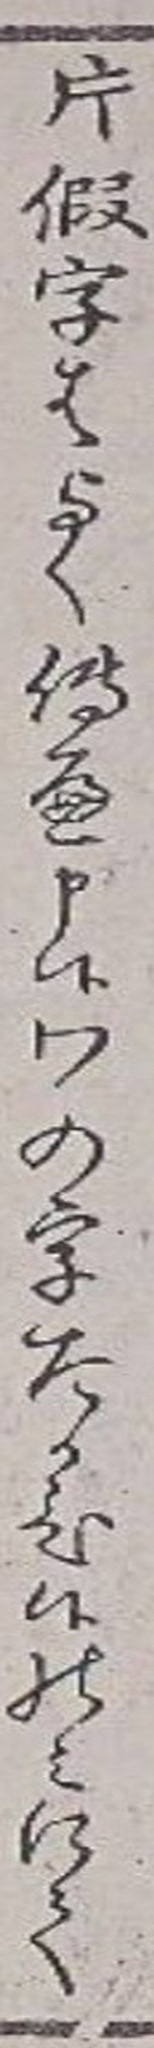片仮名はよく伝へ申候ワの字たかひ候のみにて
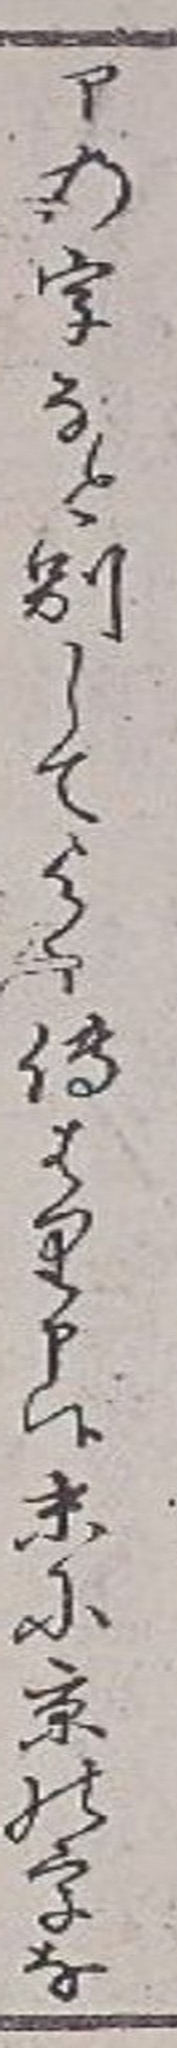アの字なと別してよく伝はり申候未に京の字な
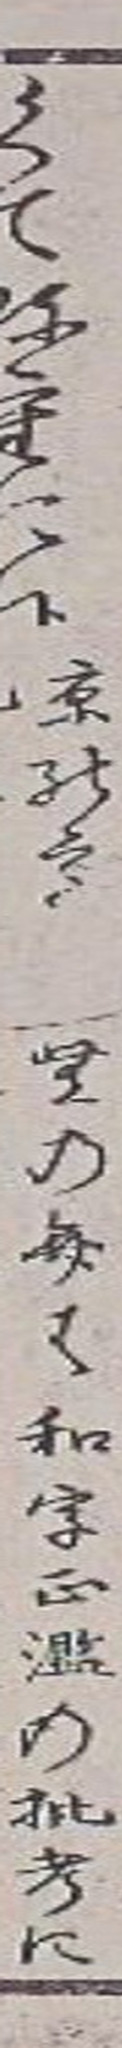くて珍重に候京の字無の弁は和字正濫の批考に
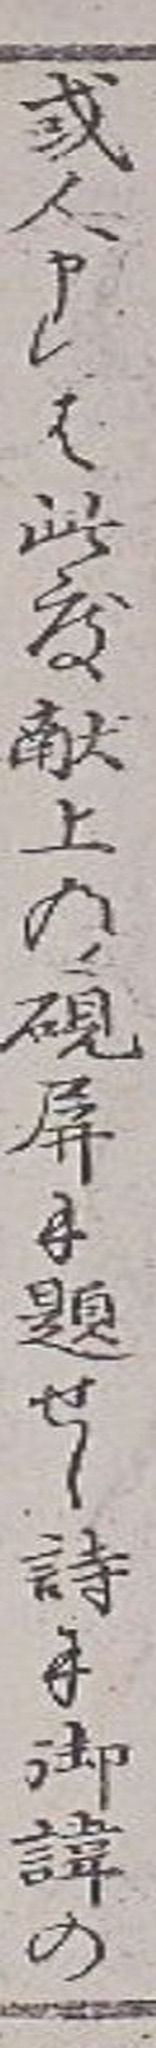或人申候は此度献上の硯屏に題せし詩に御諱の
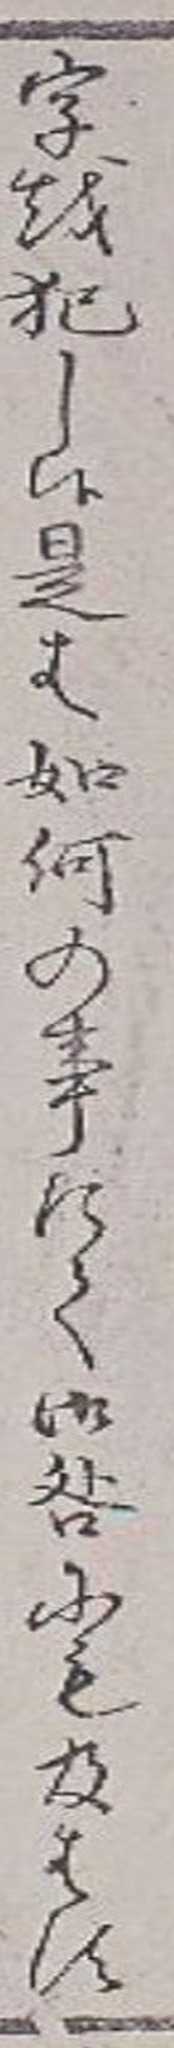字を犯し候是は如何の事にて御咎にも及はす
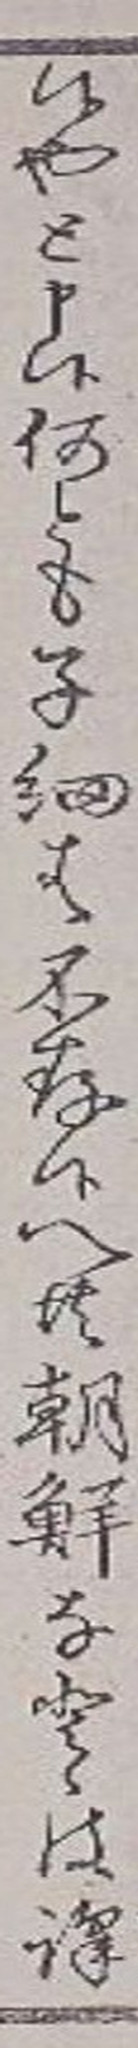候やと申候何とも子細は不存候へ共朝鮮なとゝは訳
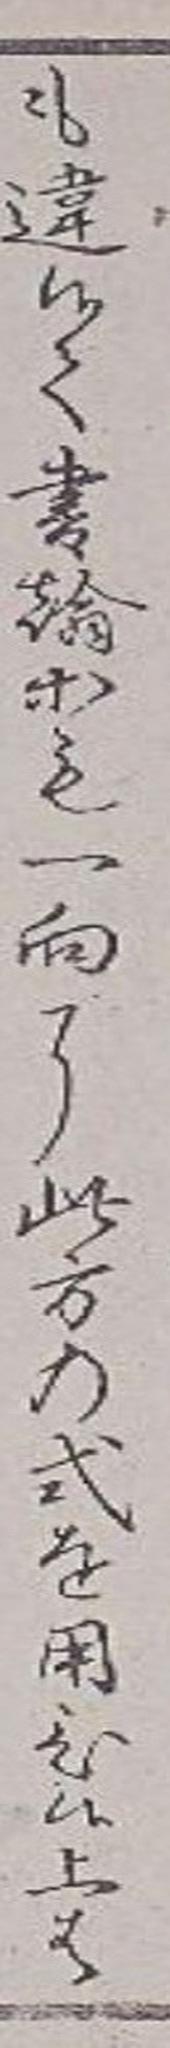も違候て書翰等も一向に此方の式を用ひ候上は
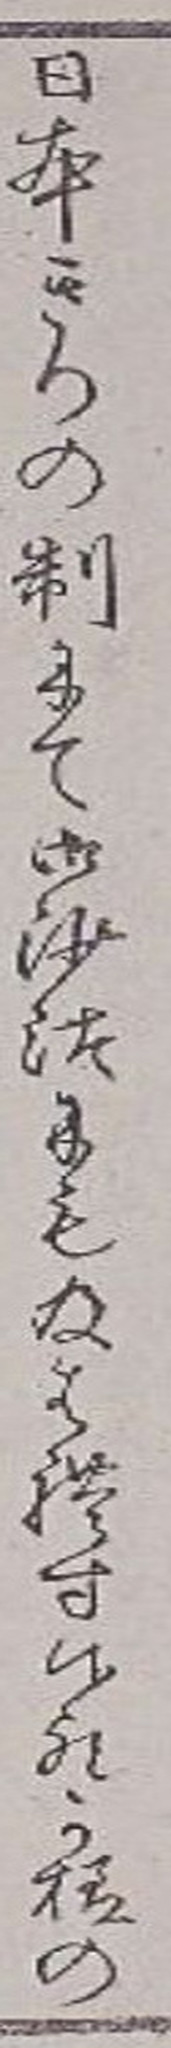日本きりの制にて御沙汰にも及はれす候歟か様の
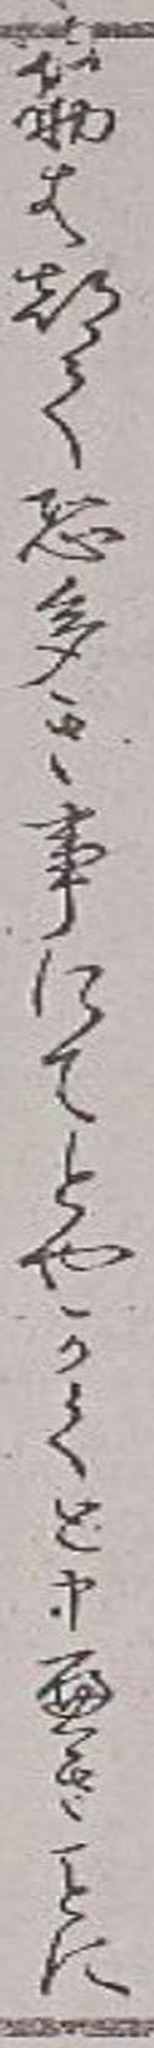筋は都て恐多き事にてとやかくと申へきことに
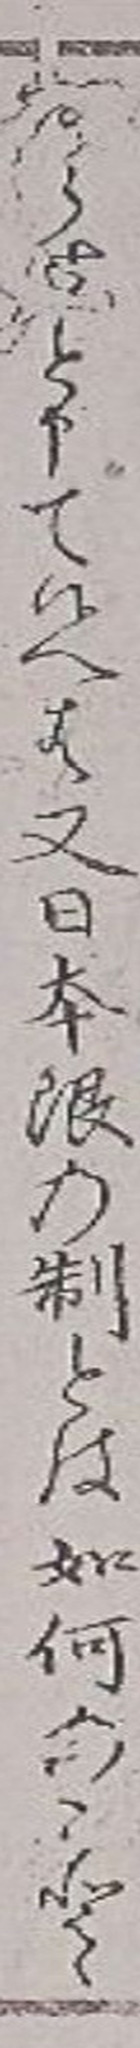あらすと申て候へは又日本限の制とは如何のことゝ
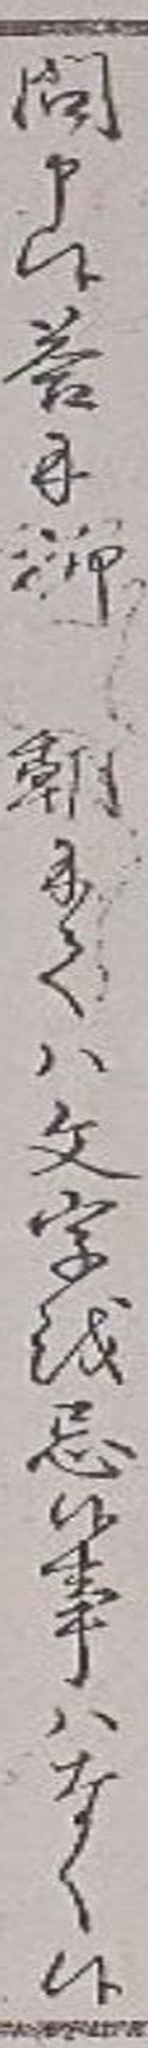問申候答に抑朝にては文字を忌候事はなく候
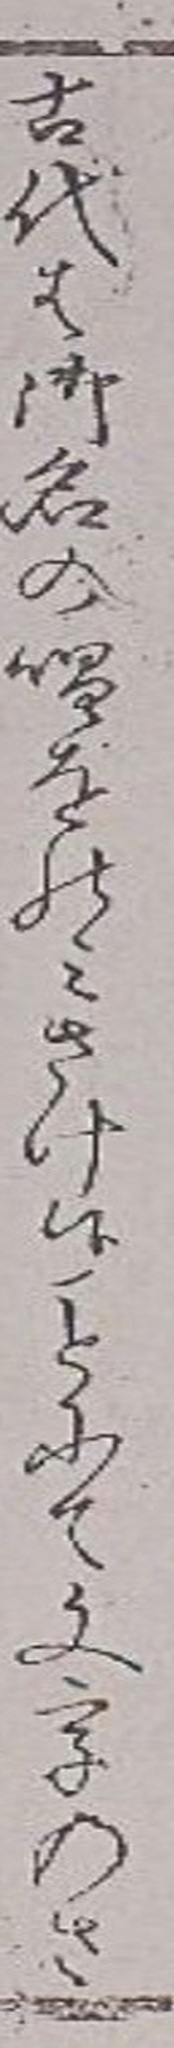古代は御名の唱をのみさけ候ことにて文字のさ
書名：琉球状
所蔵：University of the Ryukyus Library
